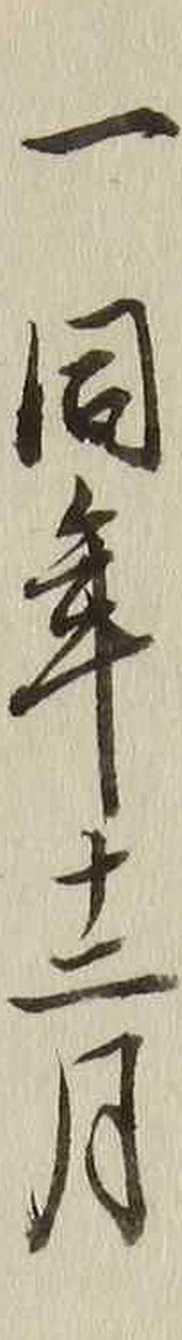一同年十二月
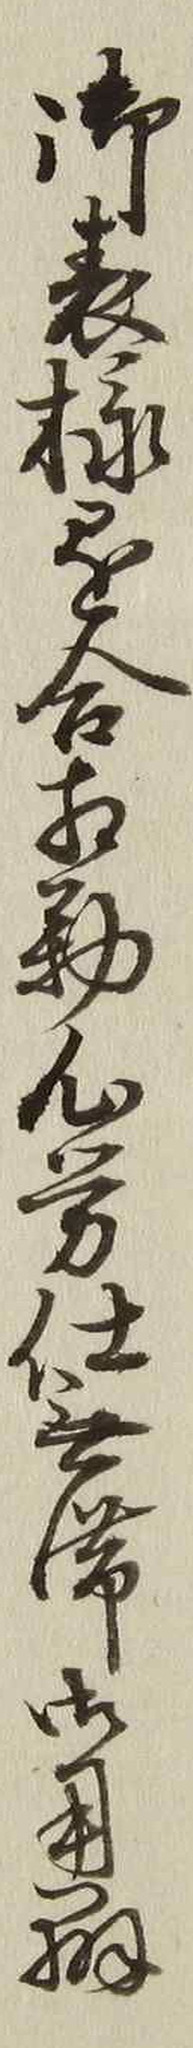御表様懸合相勤心労仕無滞御用弁
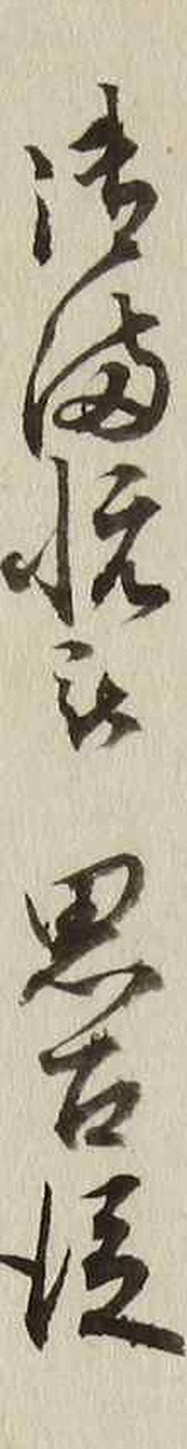御満悦被思召従
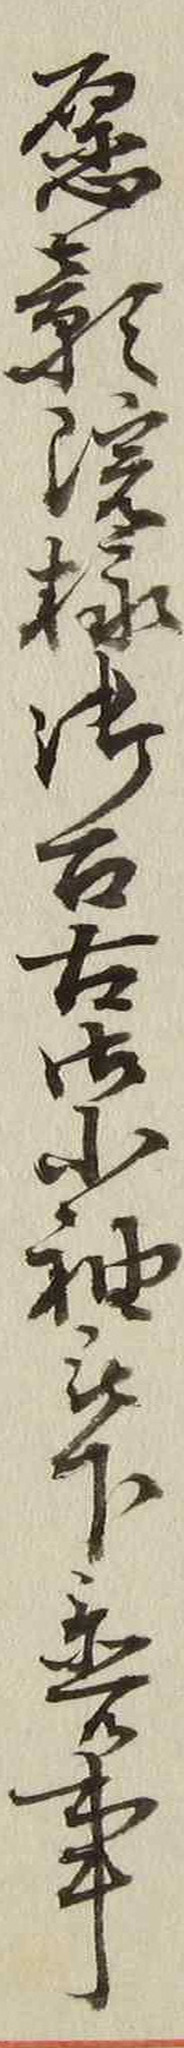愿影院様御召古御小袖被下置候事
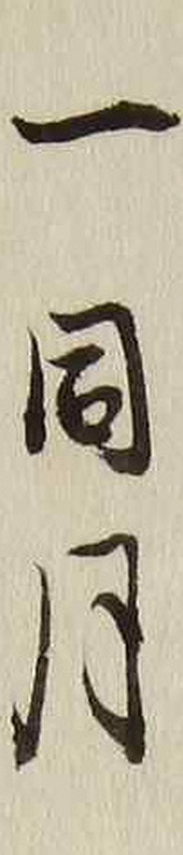一同月
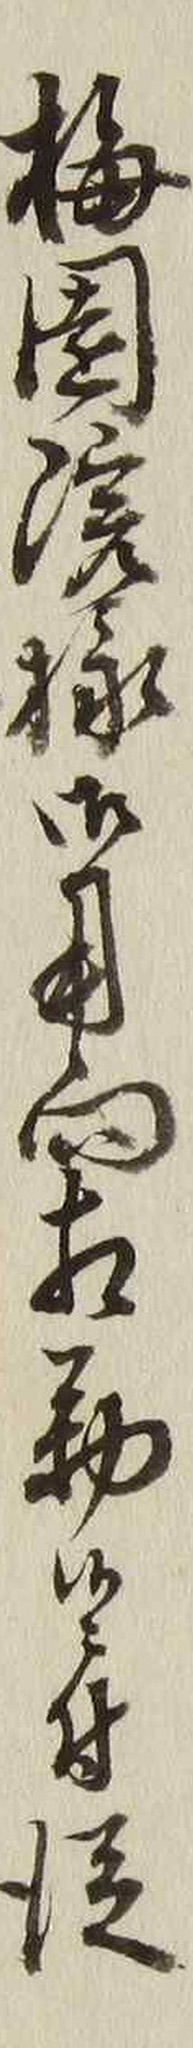梅園院様御用向相勤候ニ付従
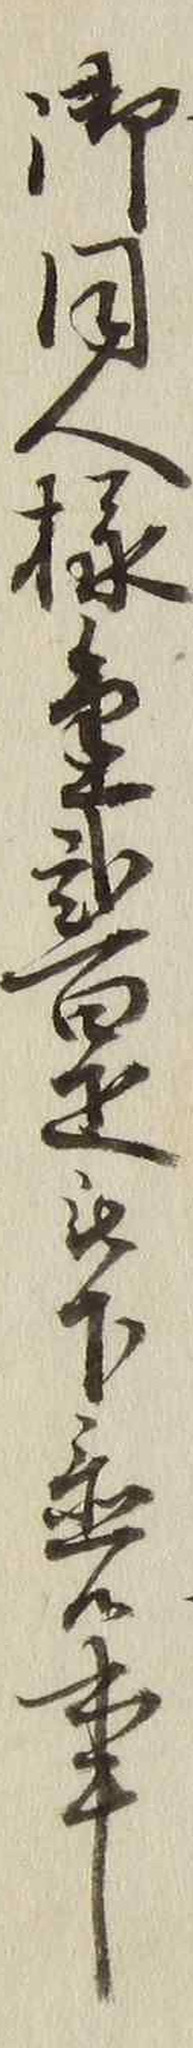御同人様金弐百疋被下置候事
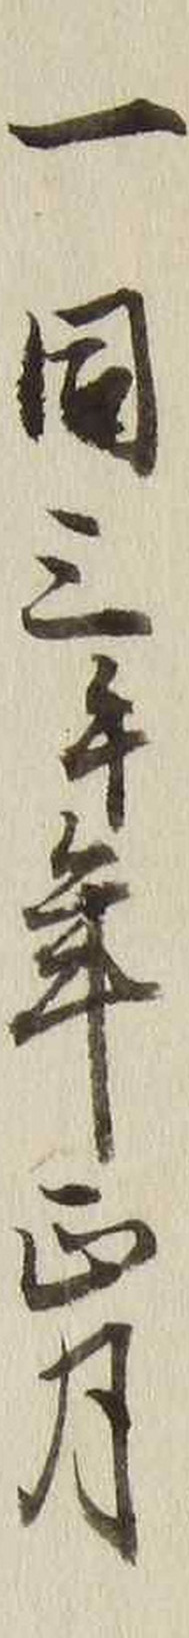一同三午年正月
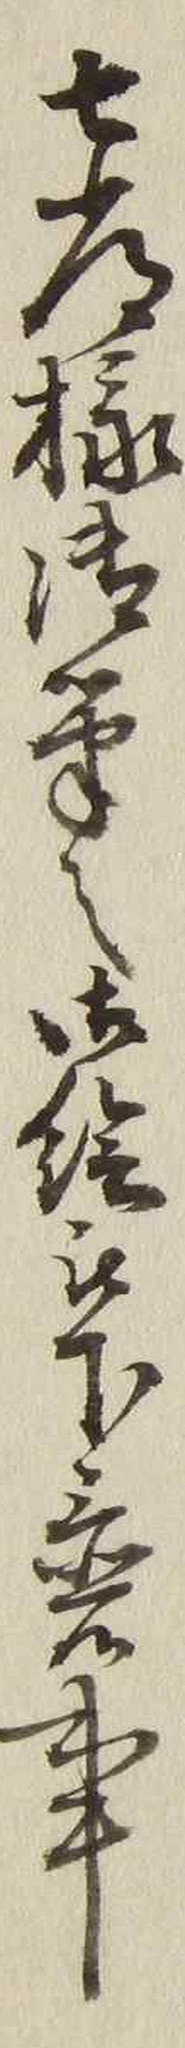土常様御筆之御絵被下置候事
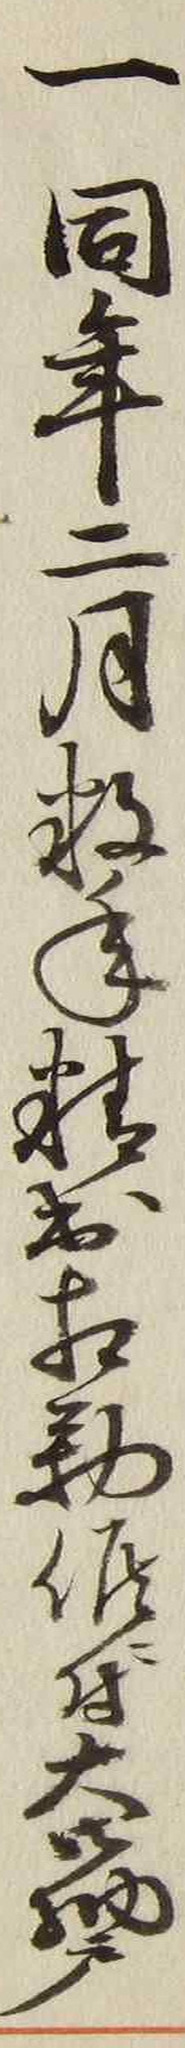一同年二月数年精出相勤候ニ付大御納戸
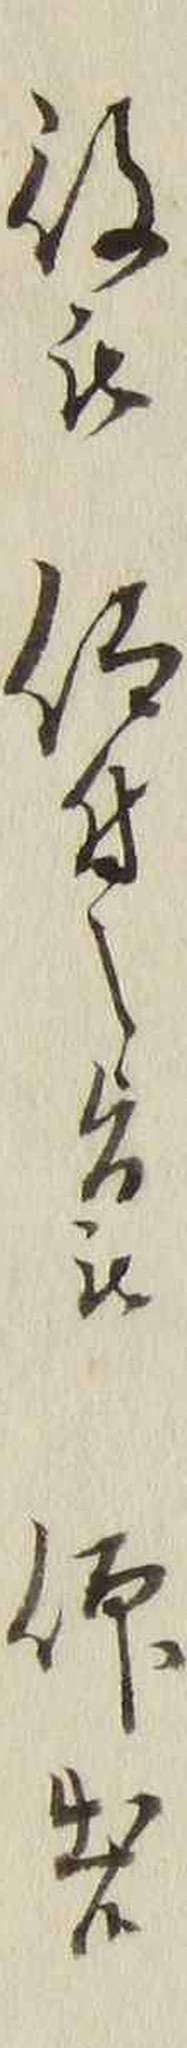役被仰付之旨被仰出候

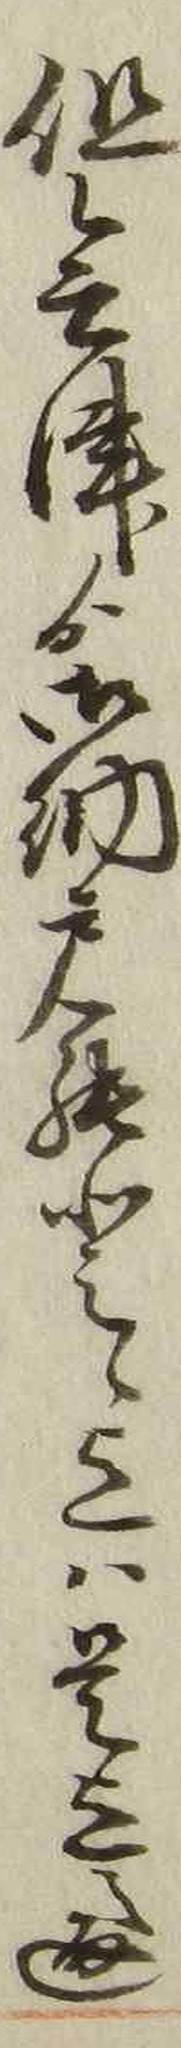但会津ゟ御納戸罷登候迄ハ是迄之通
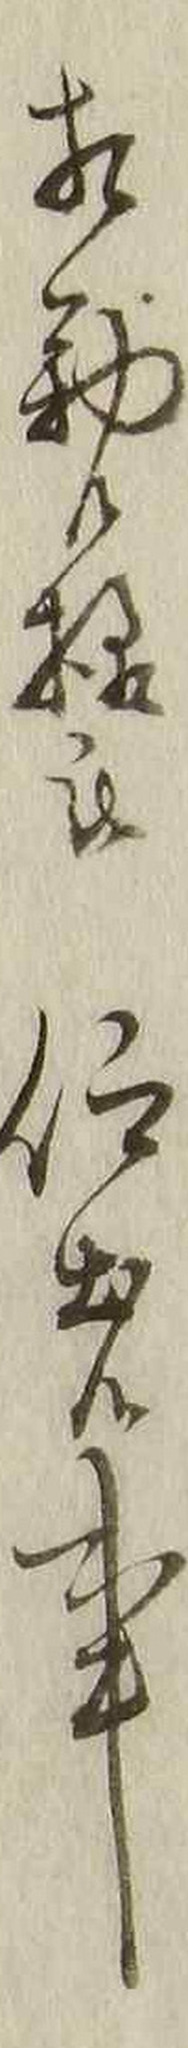相勤候様被仰出候事
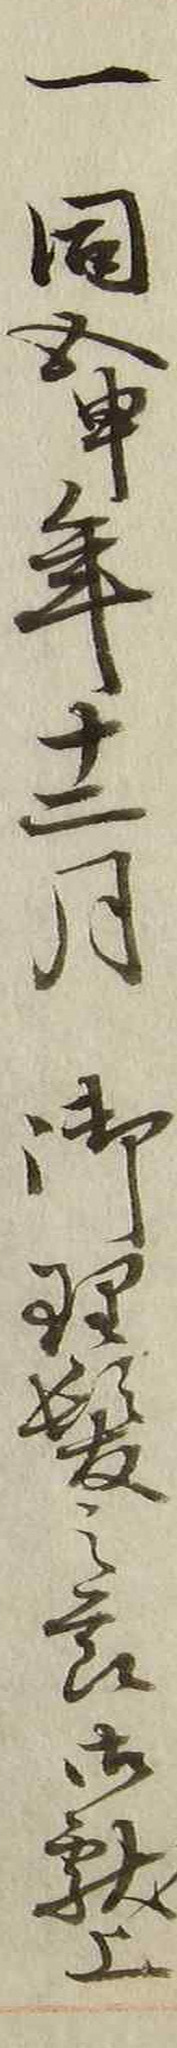一同五申年十二月御理髪之節御献上
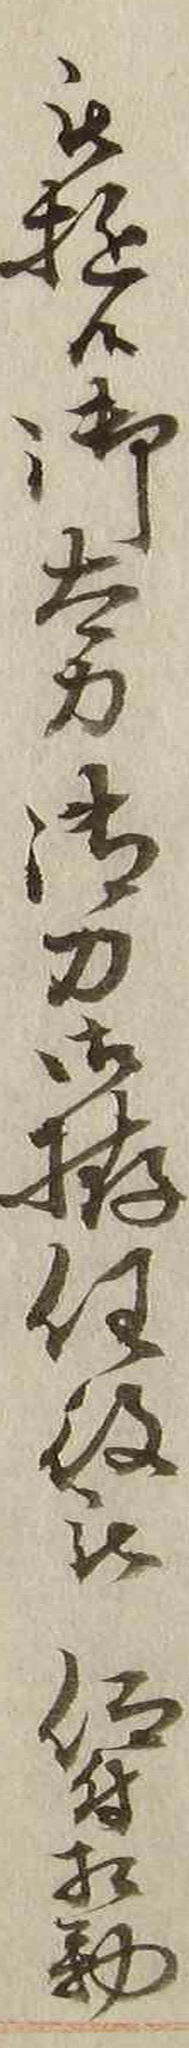被遊候御太力御刀御拵任役被仰付相勤
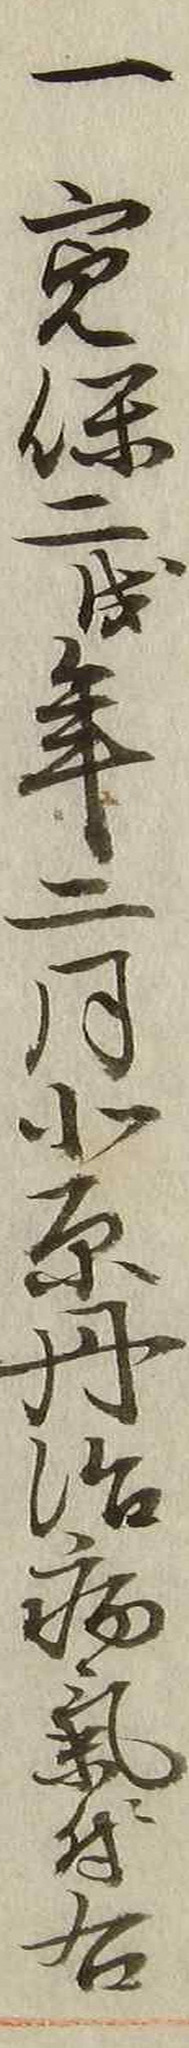一寛保二戌年二月北原丹治病気ニ付右
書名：諸士系譜　巻之23　い之部23
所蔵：会津若松市立会津図書館
